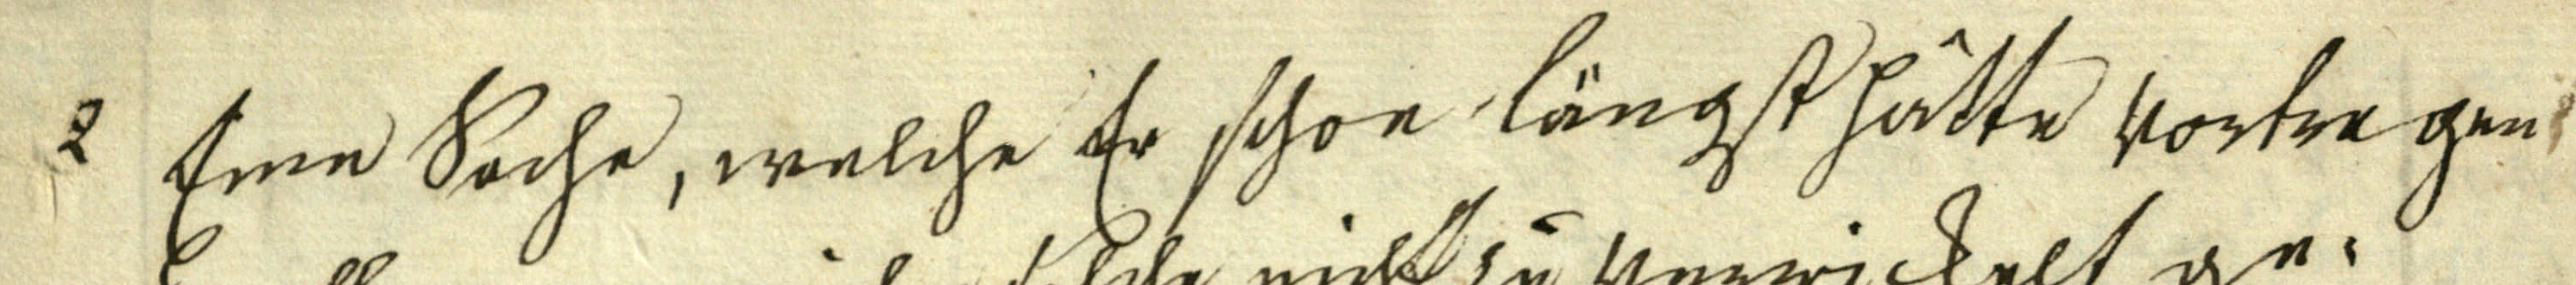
2 . Eine Sache, welche Er schon längst hätte vortragen
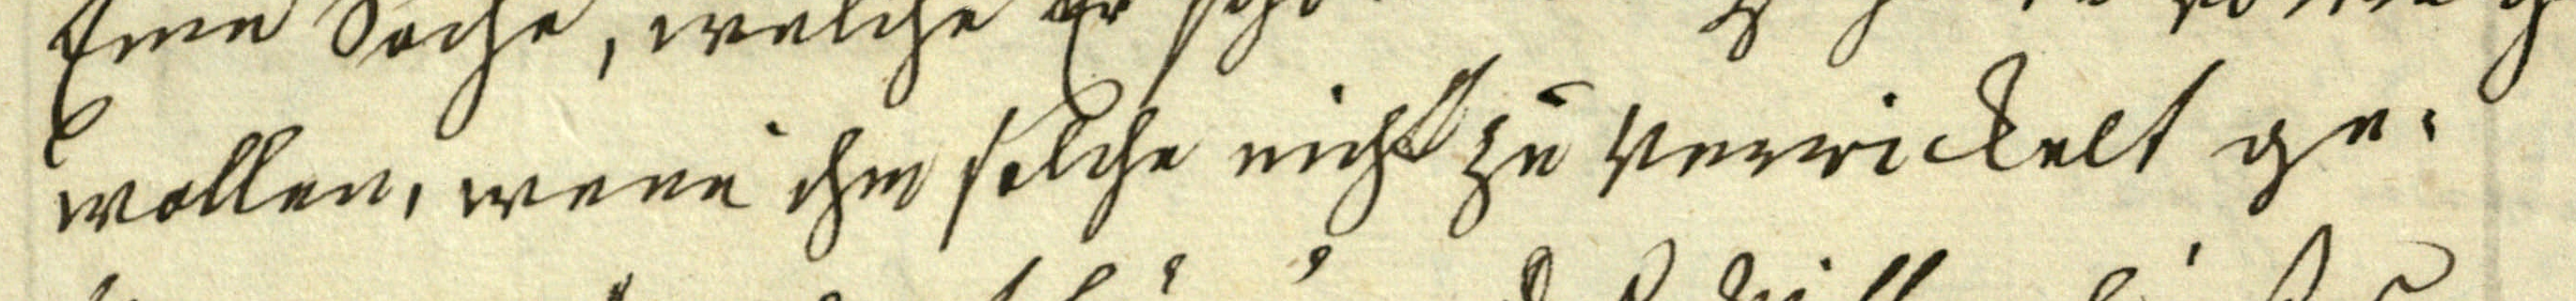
wollen, wenn ihm solche nicht zu verwickelt ge¬
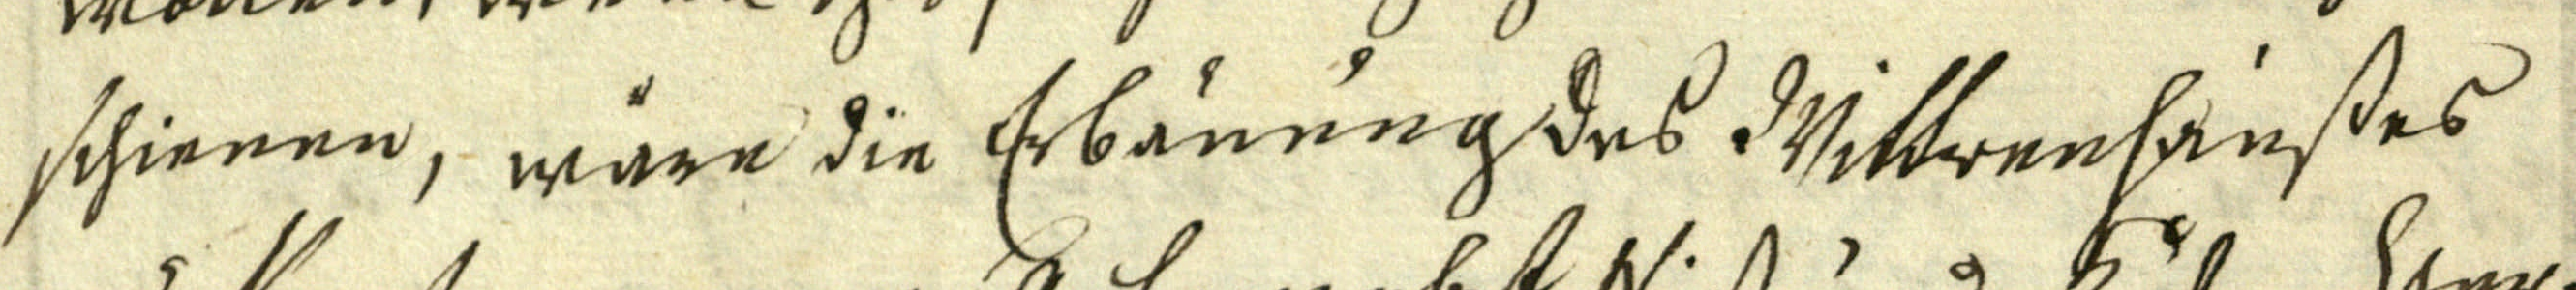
schienen, wäre die Erbauung des Wittwenhaußes
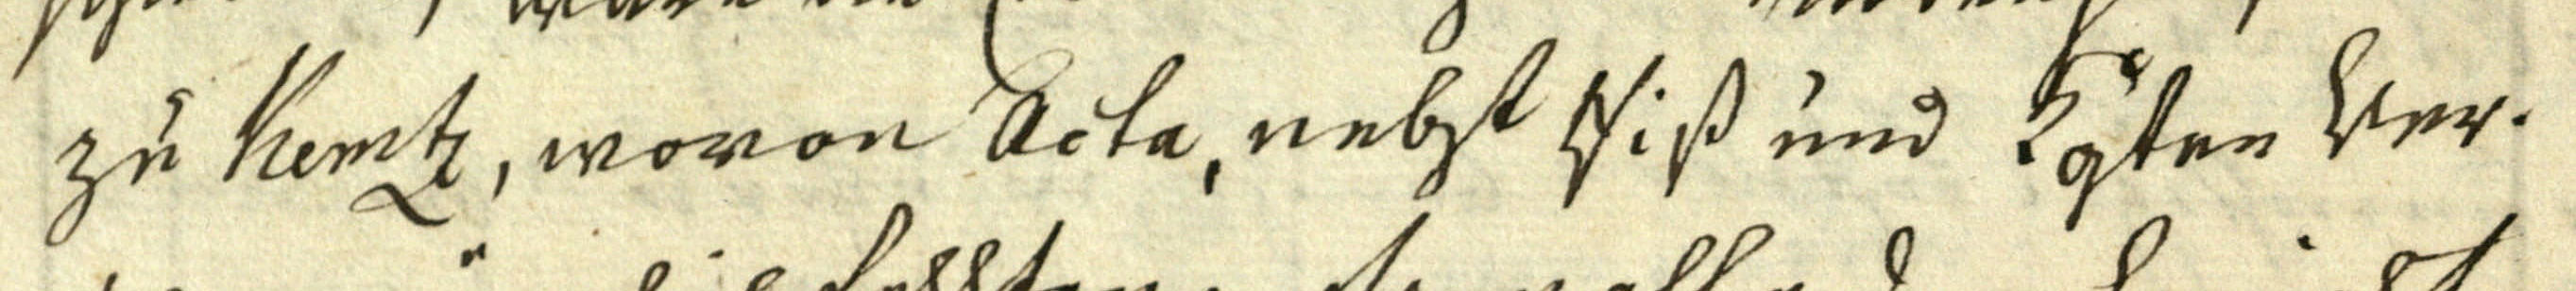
zu Kemtz, wovon Acta, nebst Riß und Kosten Ver¬
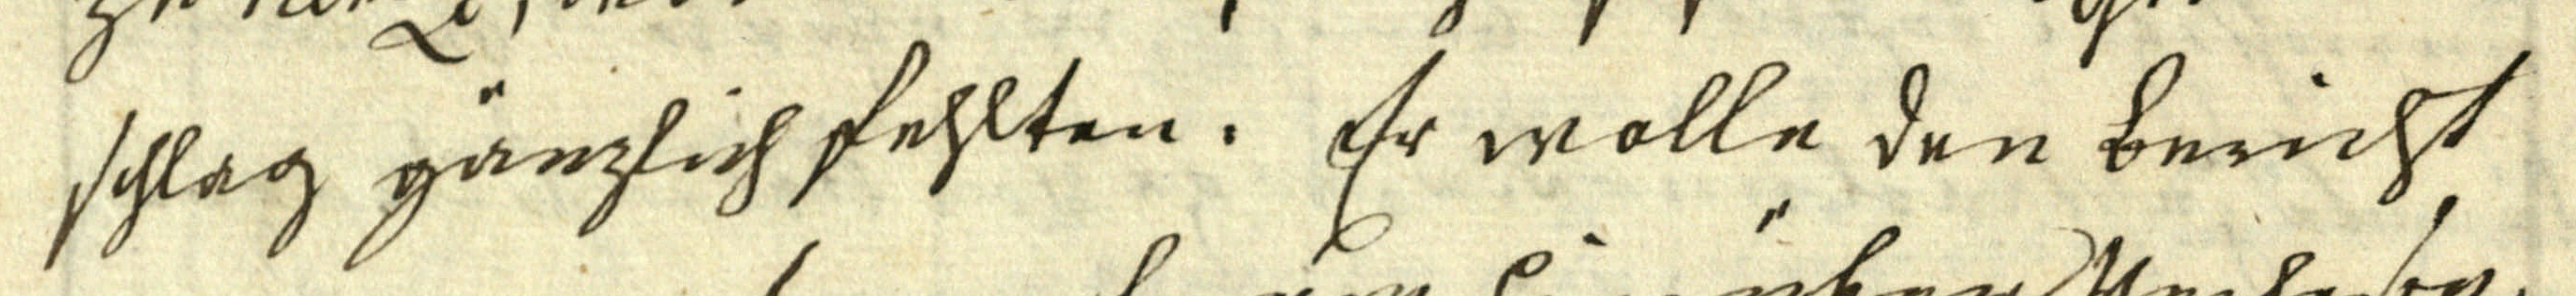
schlag gänzlich fehlten. Er wolle den Bericht
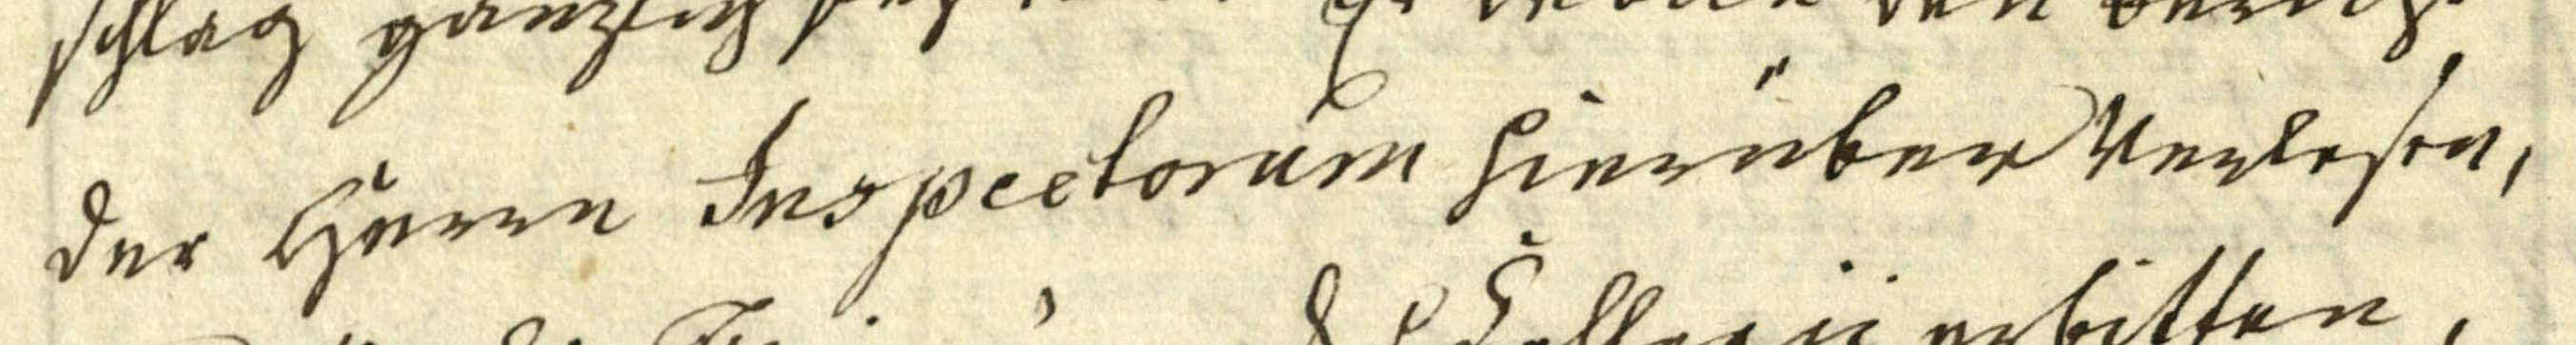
der Herrn Inspectorum hierüber verlesen,
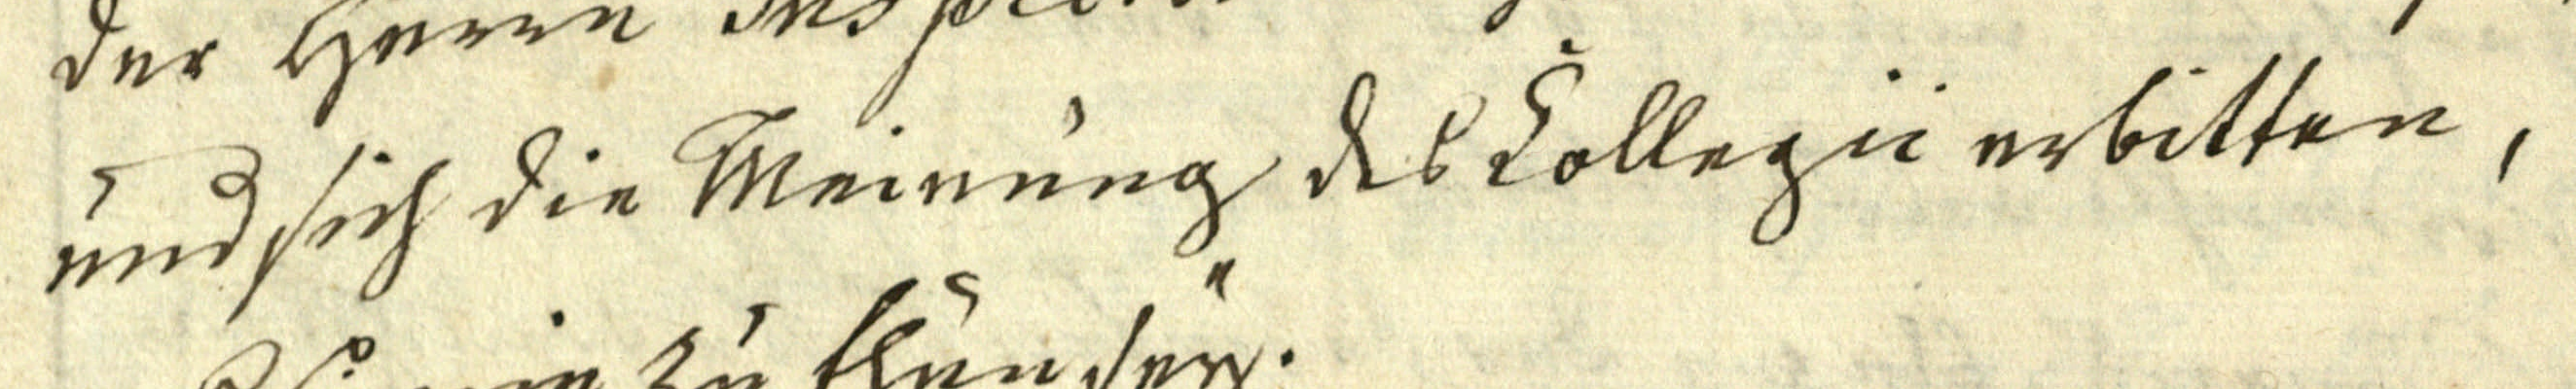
und sich die Meinung des Collegii erbitten,
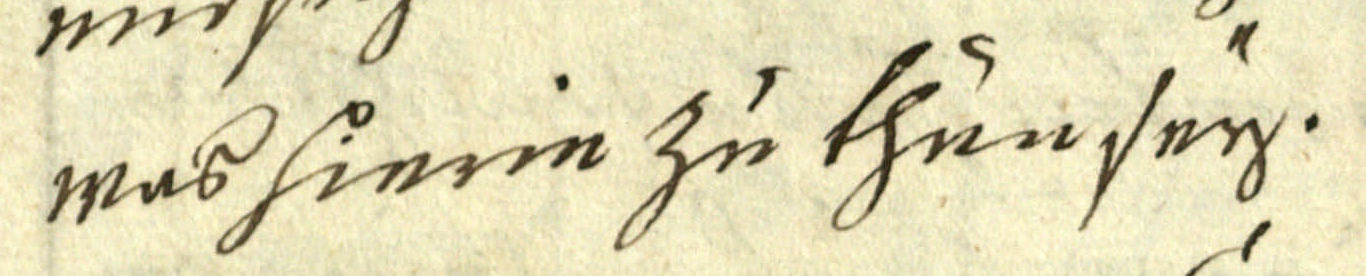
was hierin zu thun seÿ.
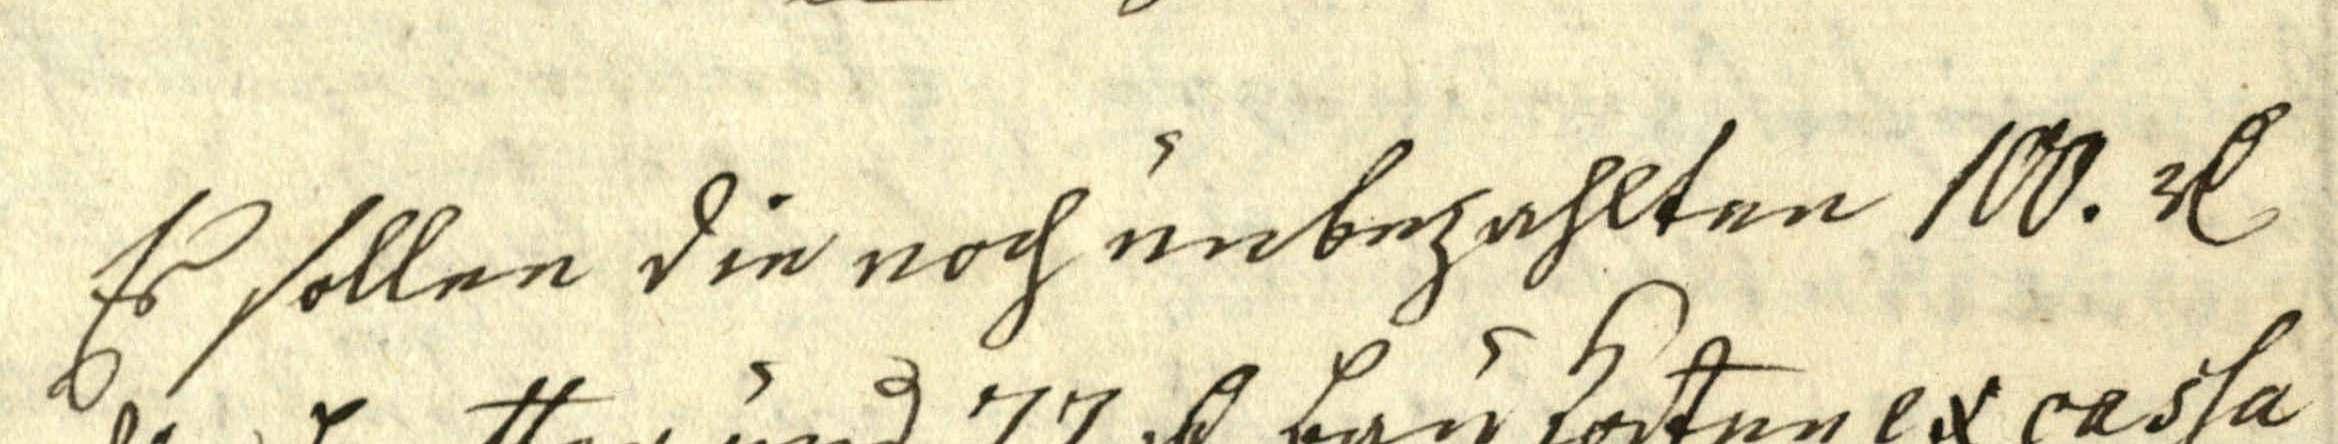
Es sollen die noch unbezahlten 100. rl
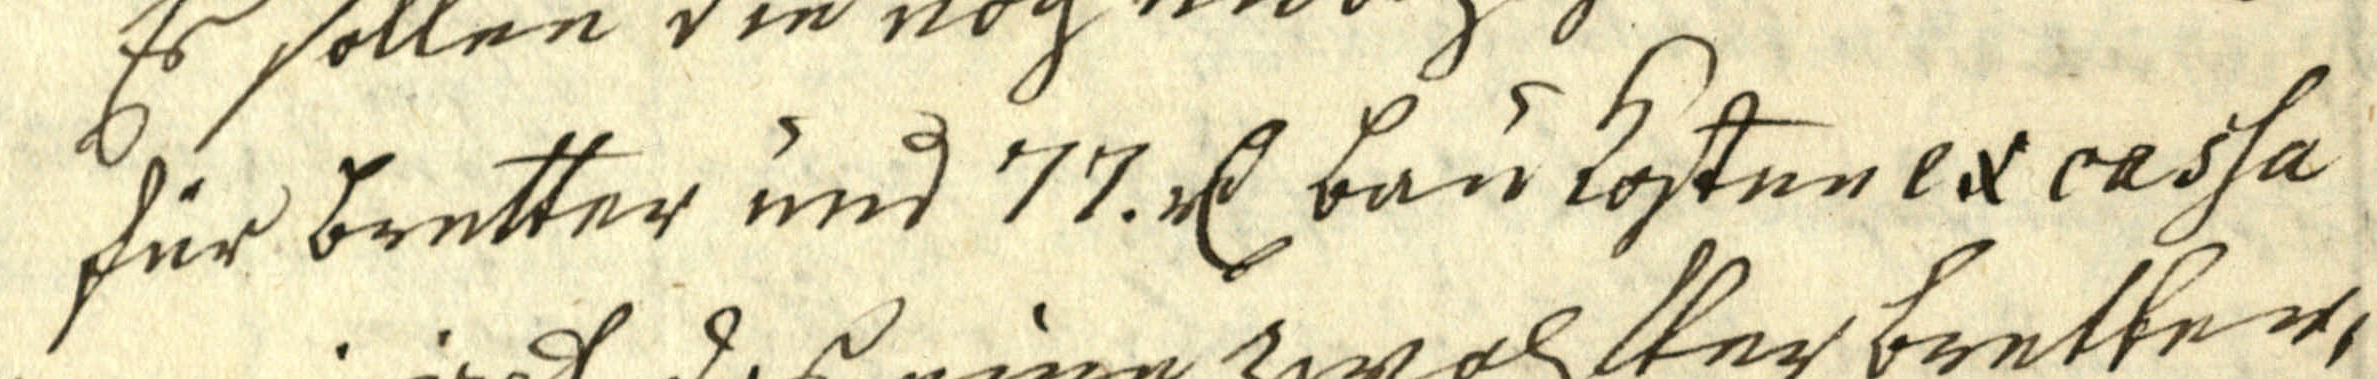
für Bretter und 77. r. Bau Kosten ex cassa
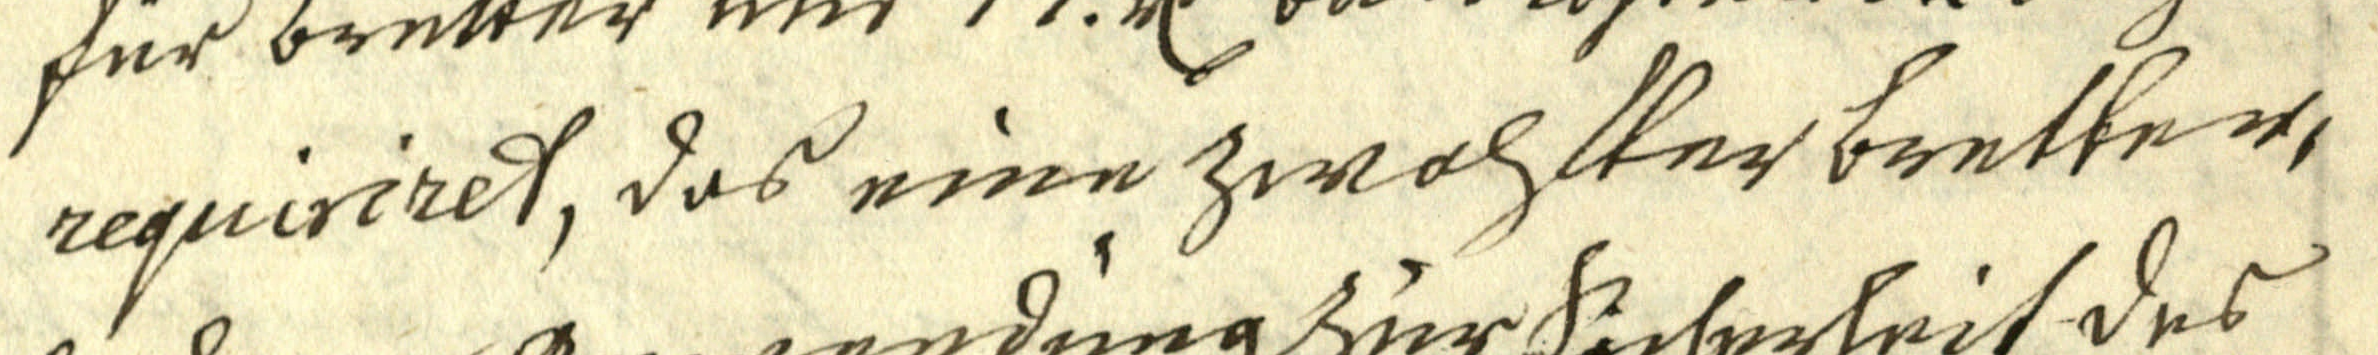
requiriret, das eine zwolfter Bretter,
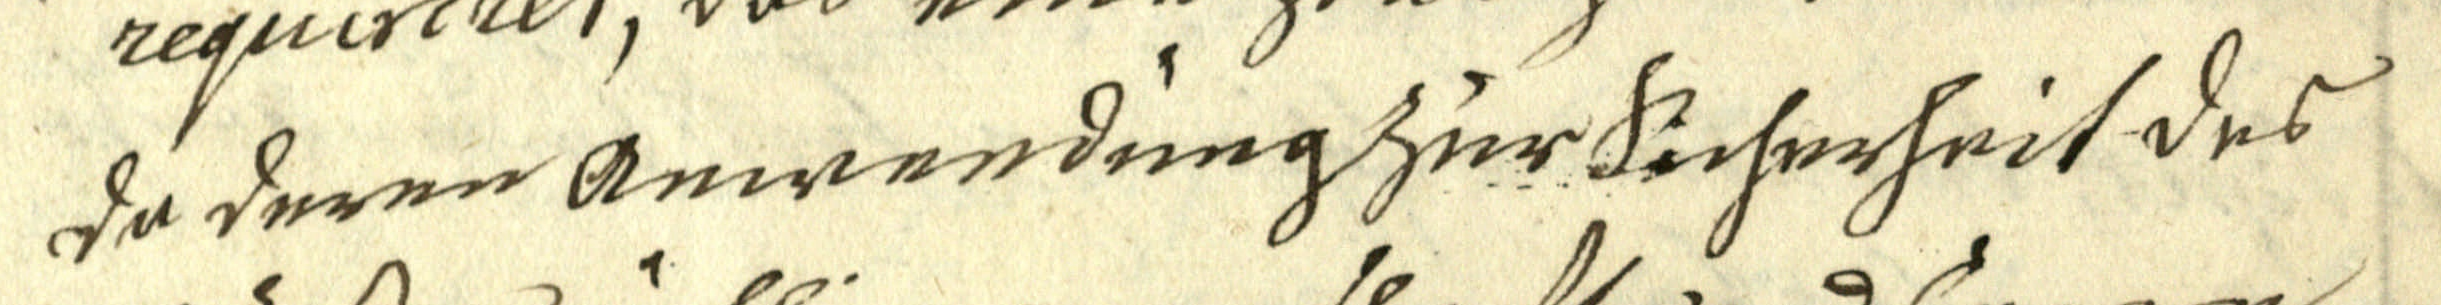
da deren Anwendung zur Sicherheit des
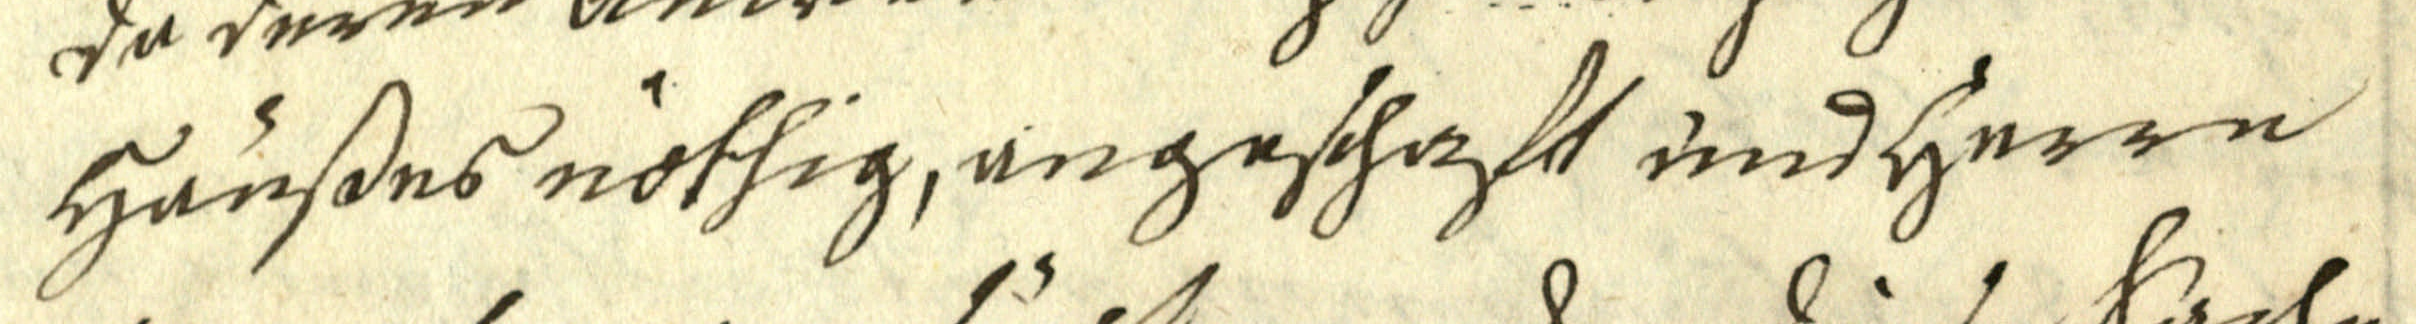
Haußes nöthig, angeschaft und Herrn
